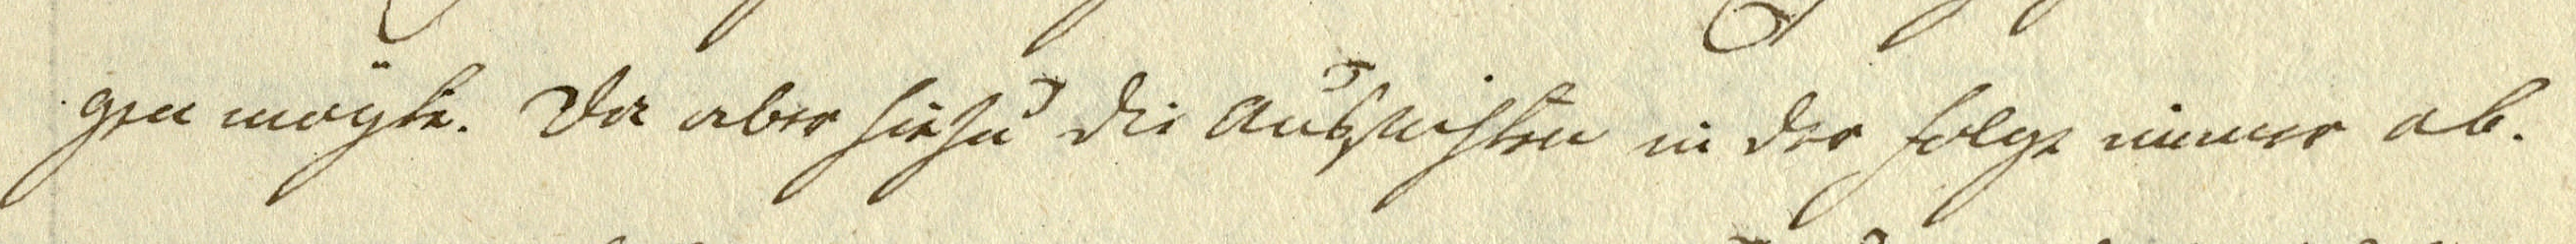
gen mögte. Da aber hiezu die Aussichten in der Folge immer ab¬
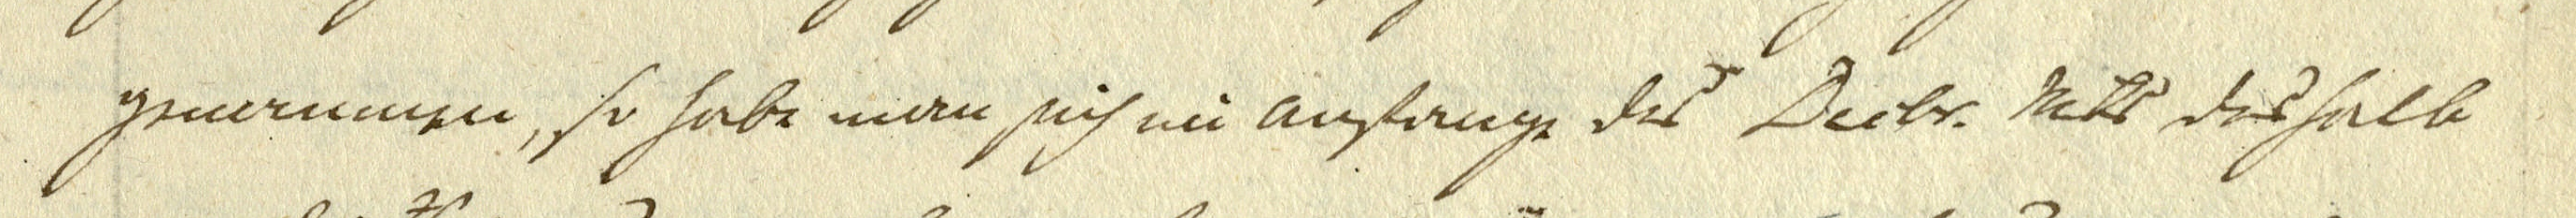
genommen, so habe man sich im Anfange des Decbr. Mts. deshalb
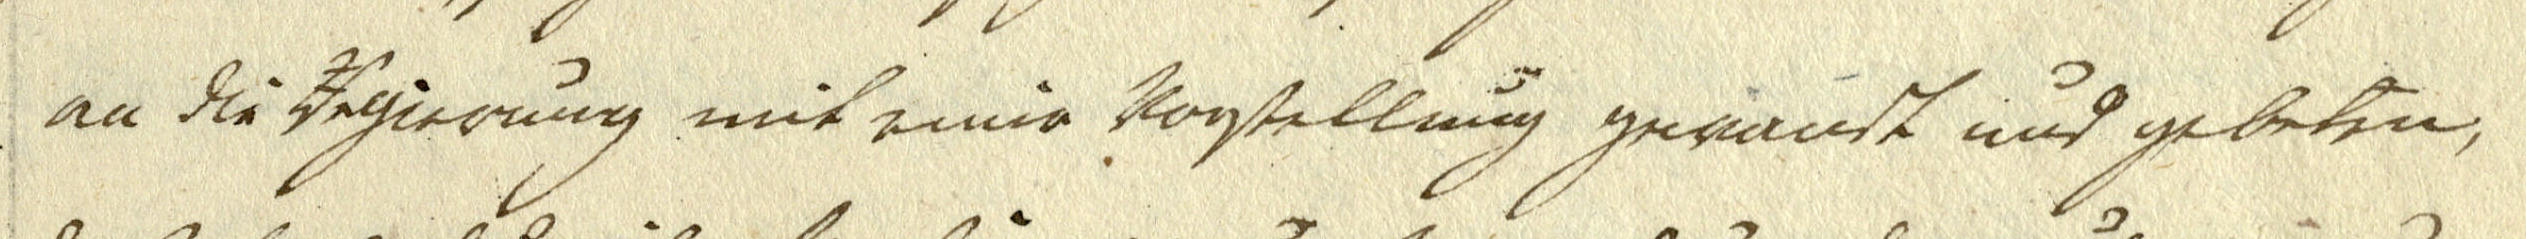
an die Regierung mit einer Vorstellung gewandt und gebethen,
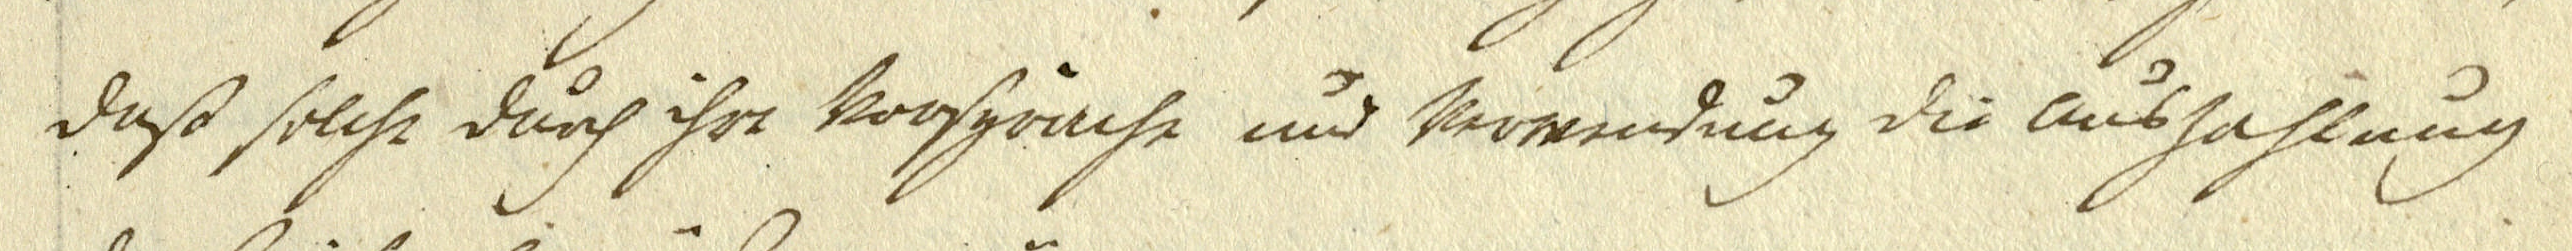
daß solche durch ihre Vorsprache und Verwendung die Auszahlung
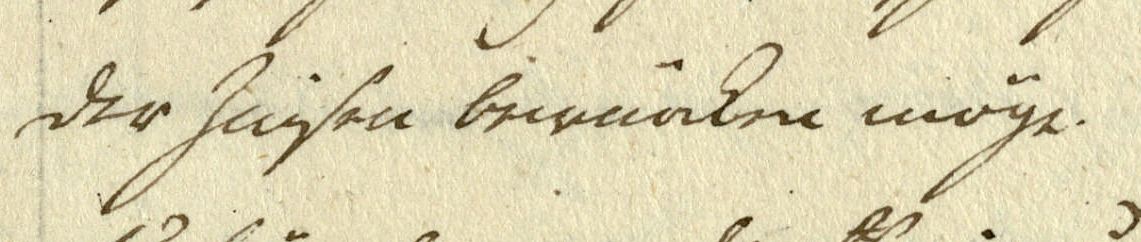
der Zinsen bewürken möge.
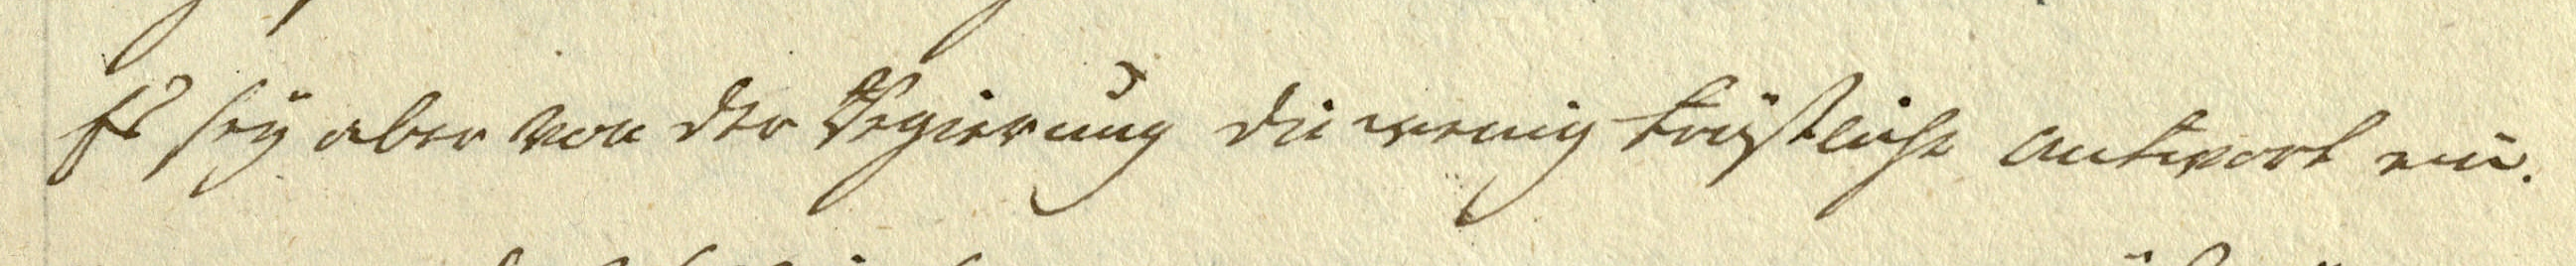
Es seÿ aber von der Regierung die wenig tröstliche Antwort ein¬
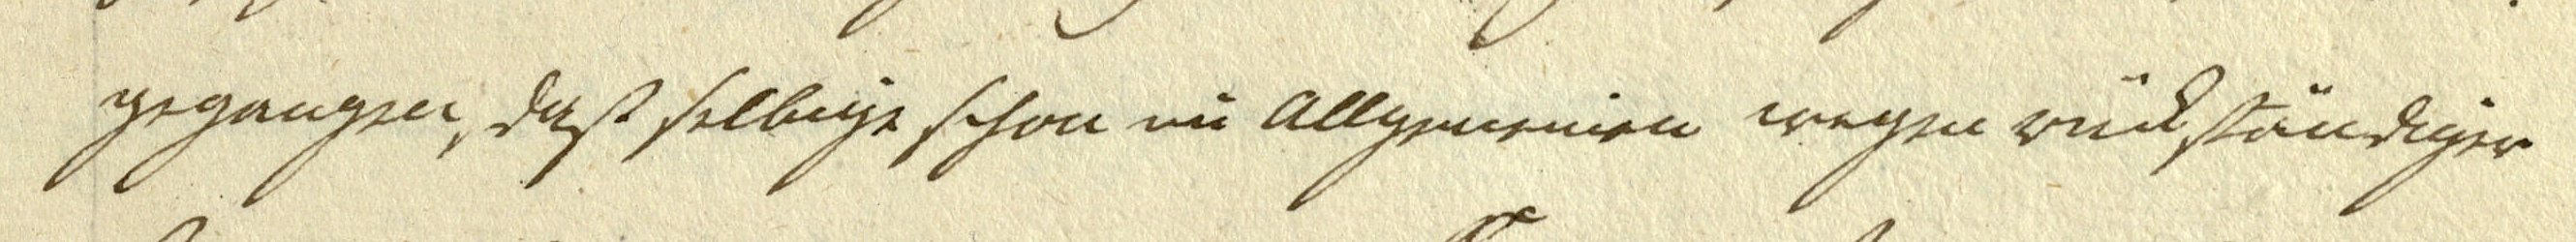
gegangen, daß selbige schon im Allgemeinen wegen rückständiger
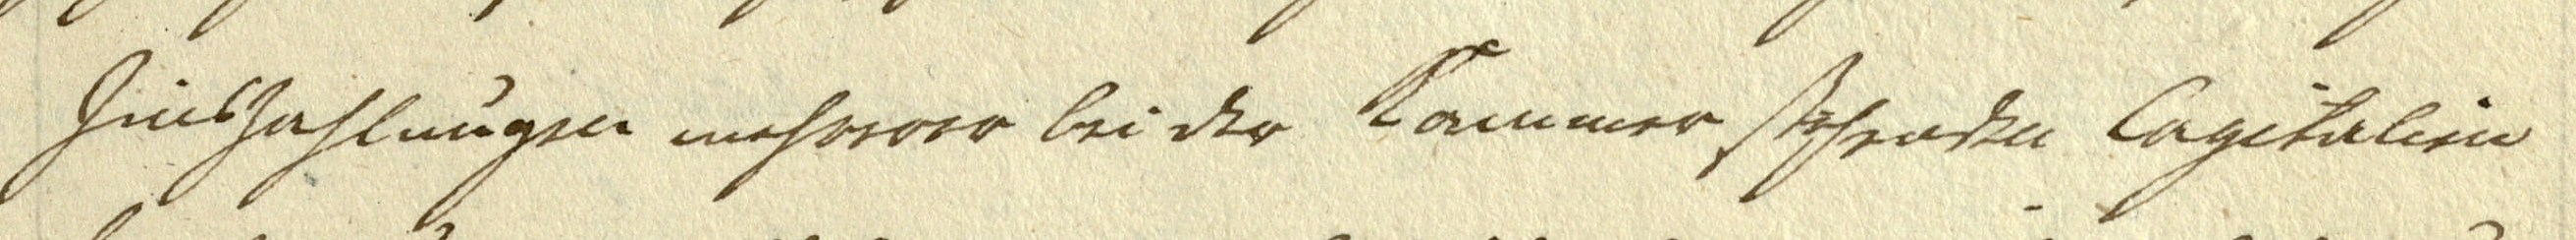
Zinszahlungen mehrerer bei der Kammer stehenden Capitalien
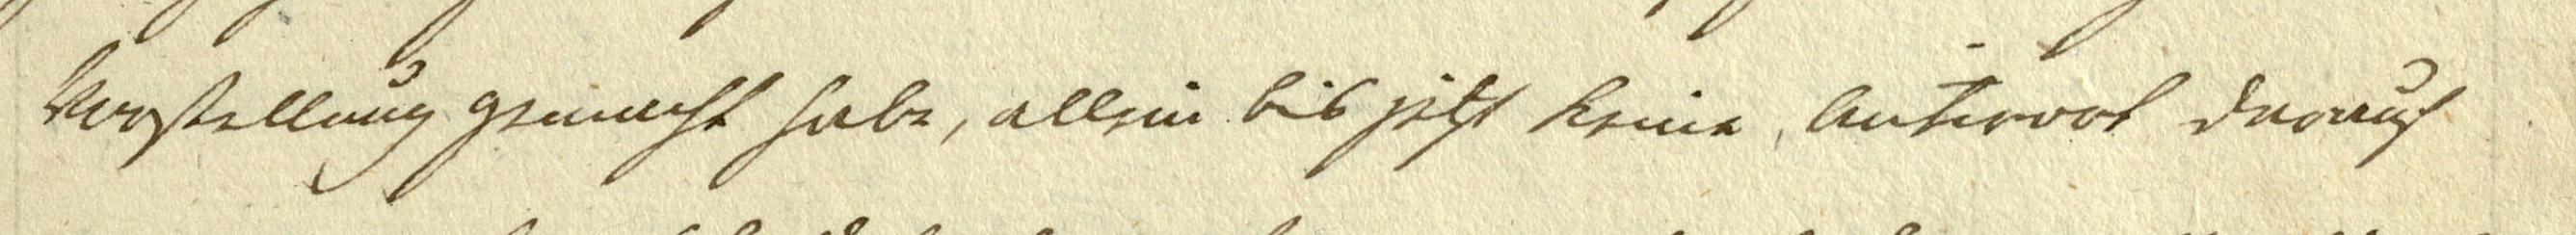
Vorstellung gemacht habe, allein bis jetzt keine, Antwort darauf
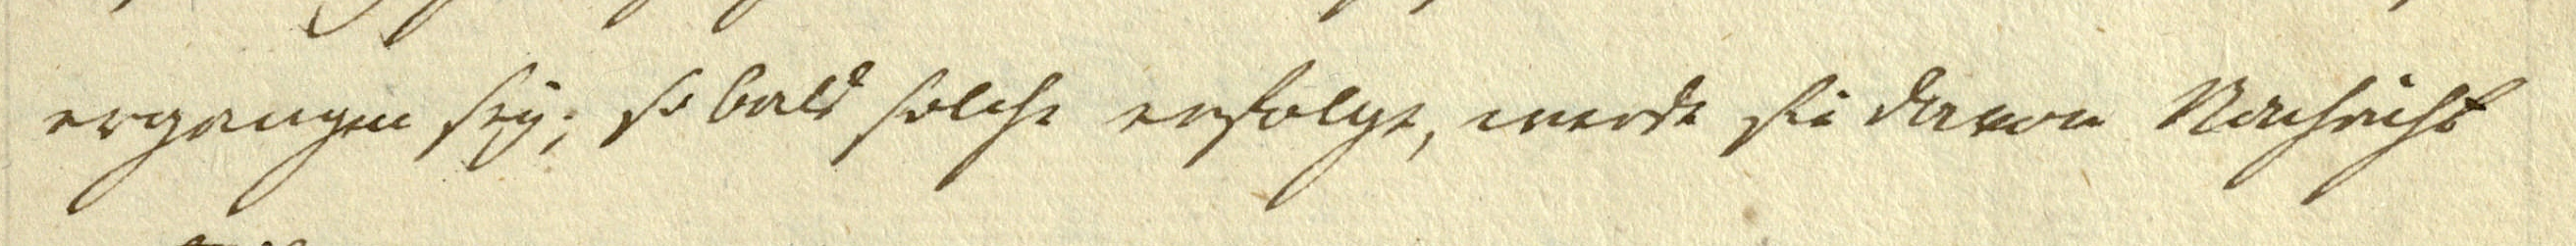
ergangen seÿ; so bald solche erfolgt, werde sie davon Nachricht
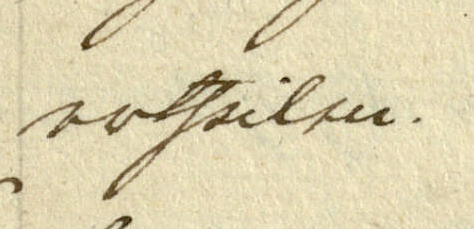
ertheilen.
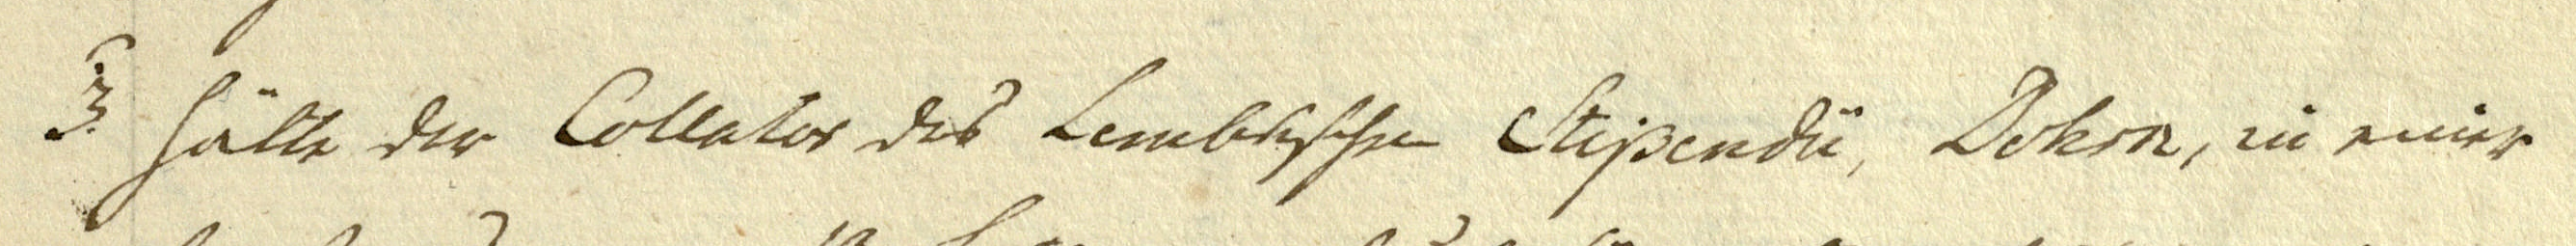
3. Hätte der Collator des Lembkschen Stipendii, Dohm, in einer
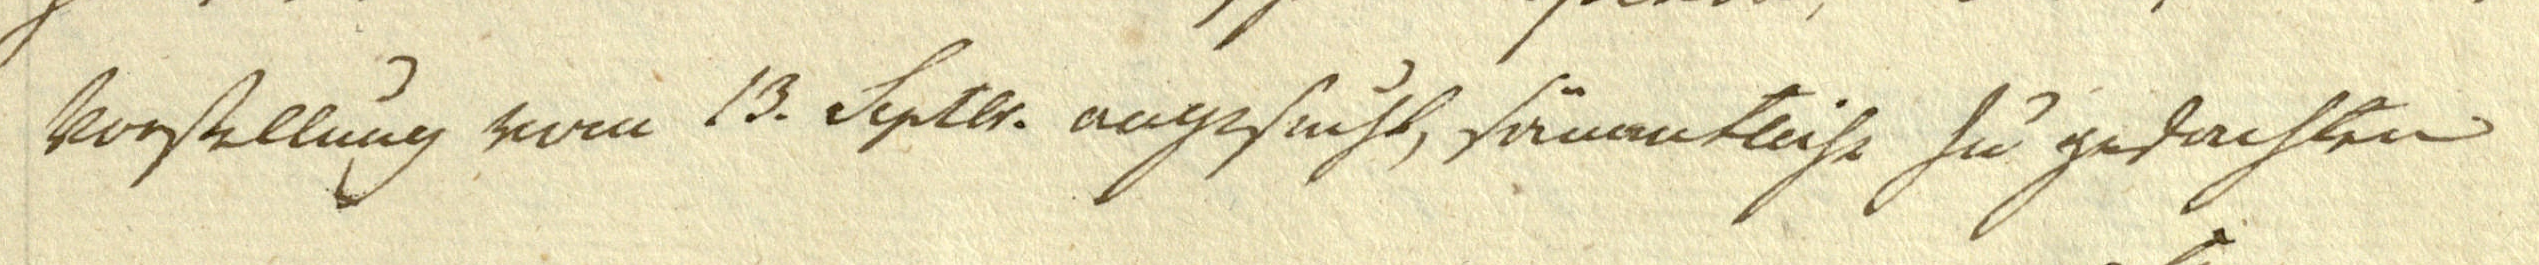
Vorstellung vom 13. Septbr. angesucht, sämmtliche zu gedachten
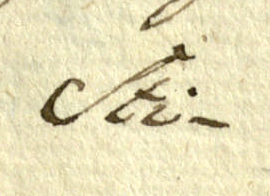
Sti¬
